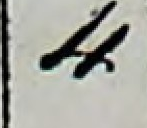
4
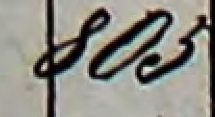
805
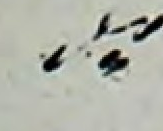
do
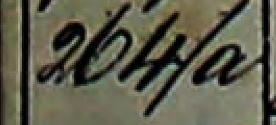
264/a
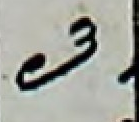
3
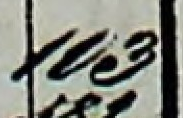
103
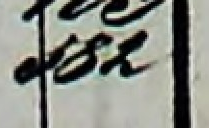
582
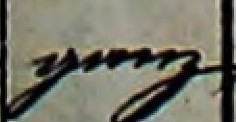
ganz
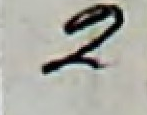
2
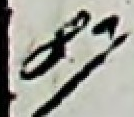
87
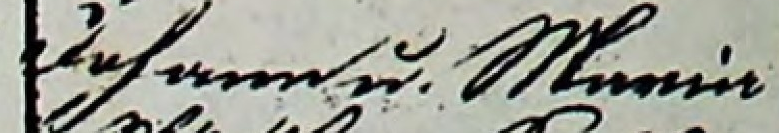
Johann u. Maria
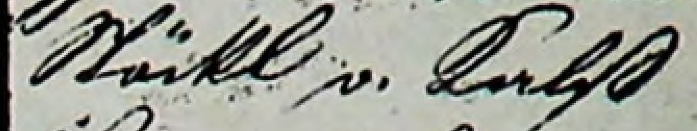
Stöckl v. Kalß
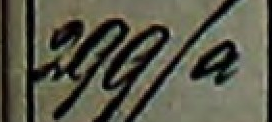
299/a
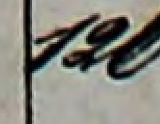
126
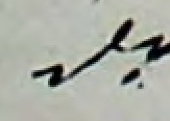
do
